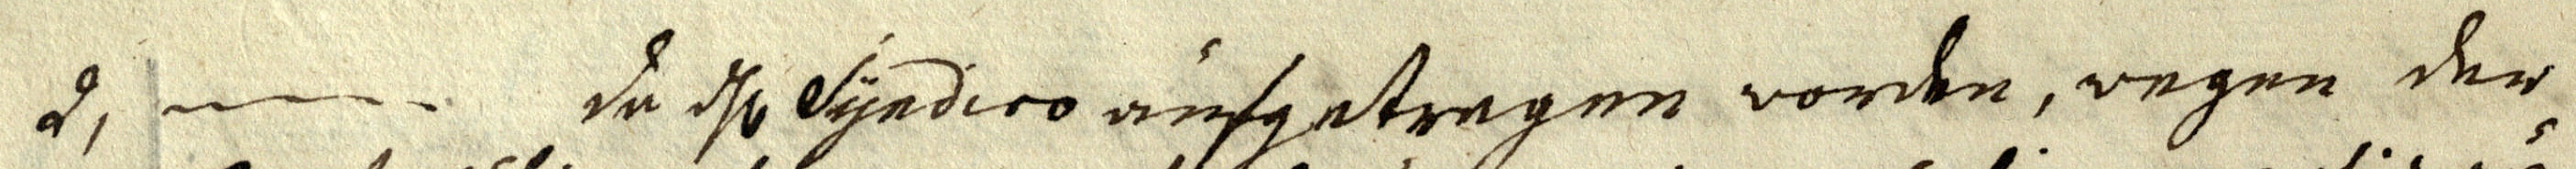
2, Da dh. Sÿndico aufgetragen worden, wegen der
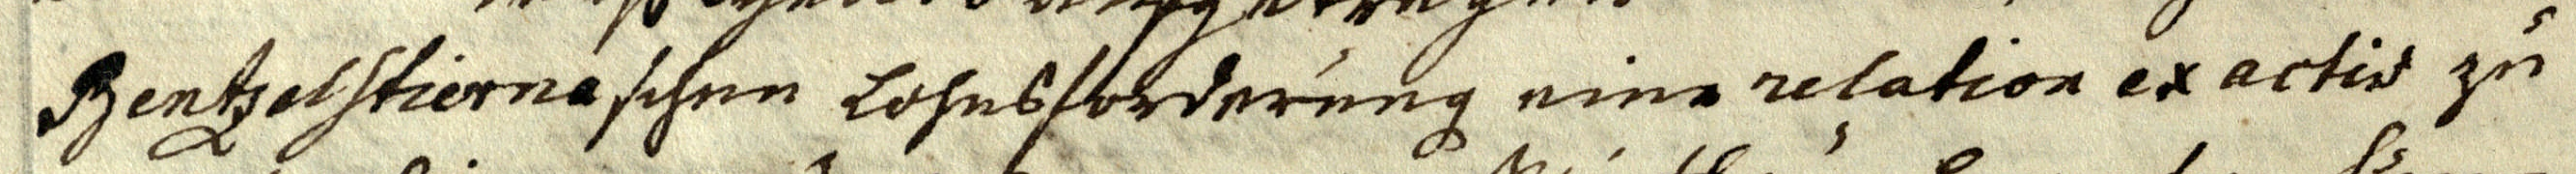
Bentzelstiernaschen Lohnsforderung eine relation ex actis zu
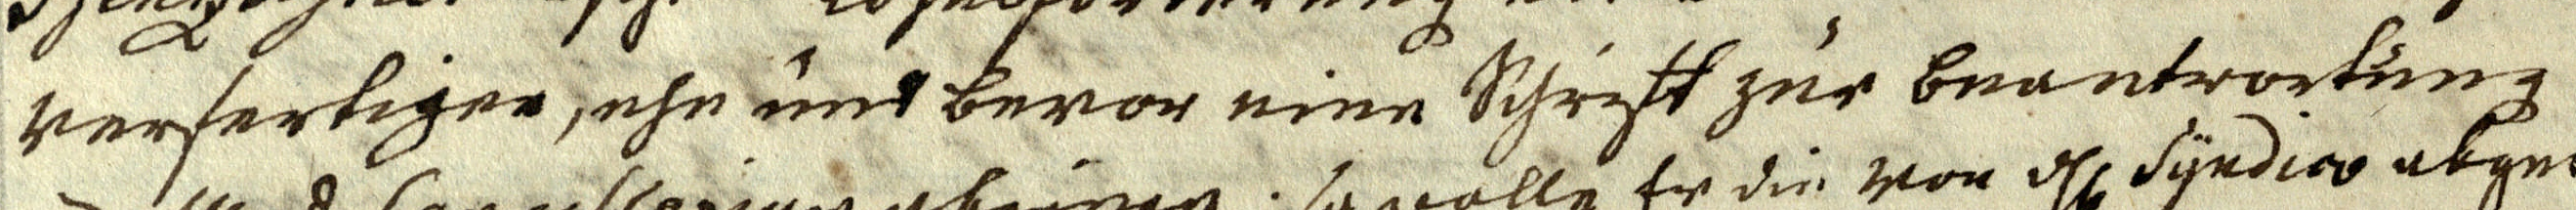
verfertigen, ehe und bevor eine Schrift zur Beantwortung
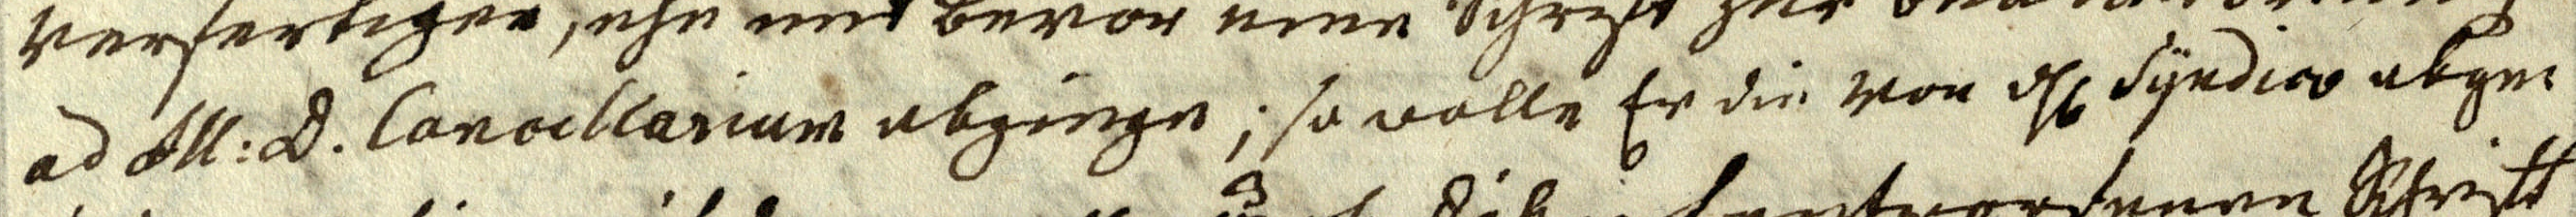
ad. M. D. Cancellarium abginge; so wolle Er die von dh. Sÿndico abge¬
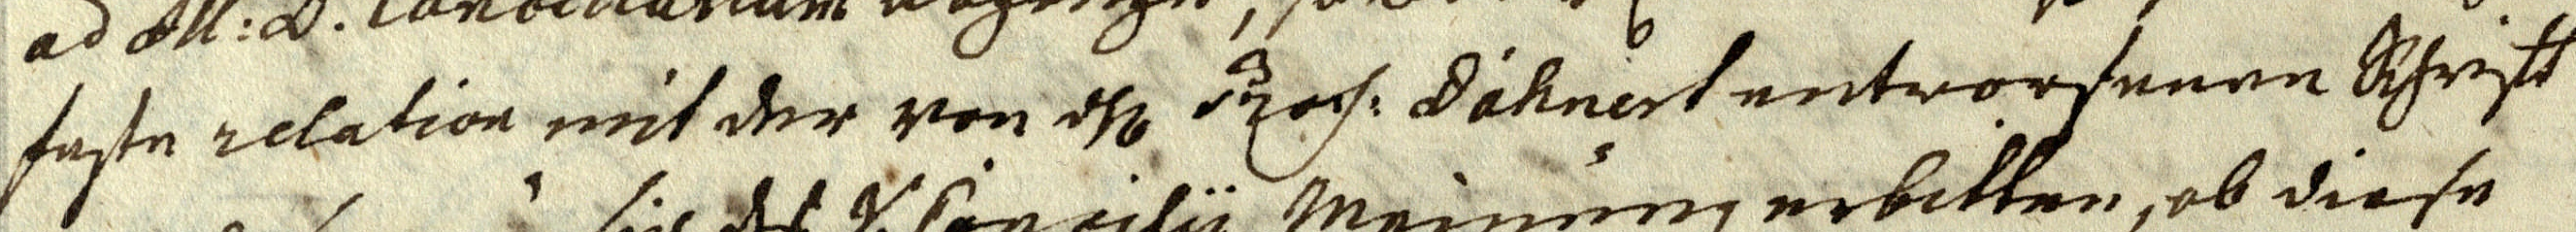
faste relation mit der von dh. Prof. Dähnert entworfenen Schrift
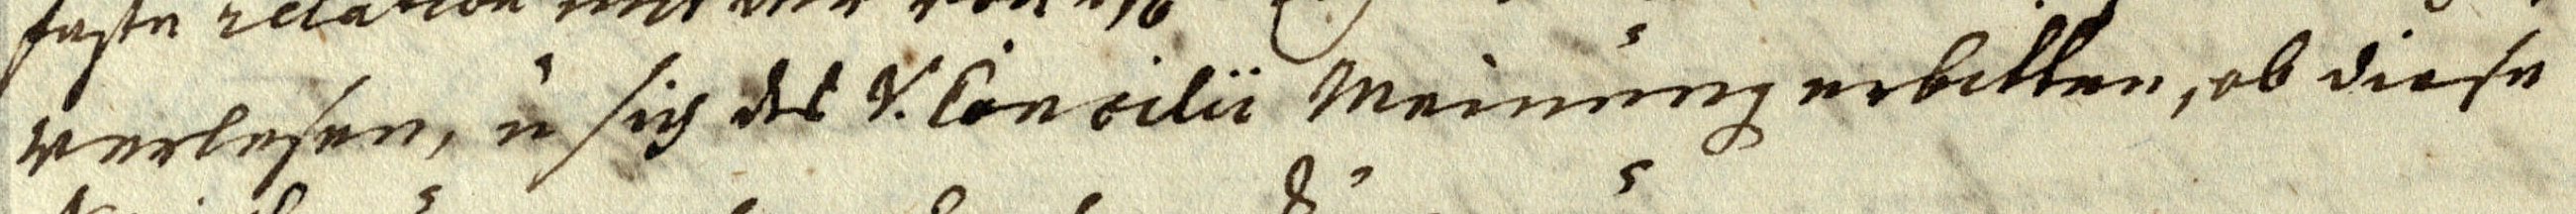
verlesen, u sich des V. Concilii Meinung erbitten, ob diese
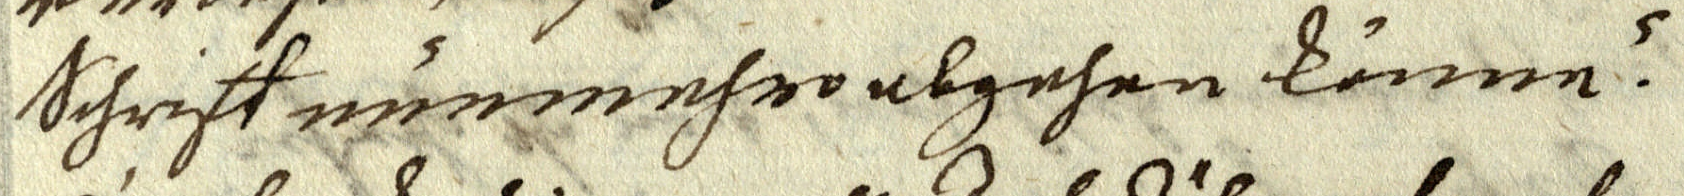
Schrift nunmehro abgehen könne?
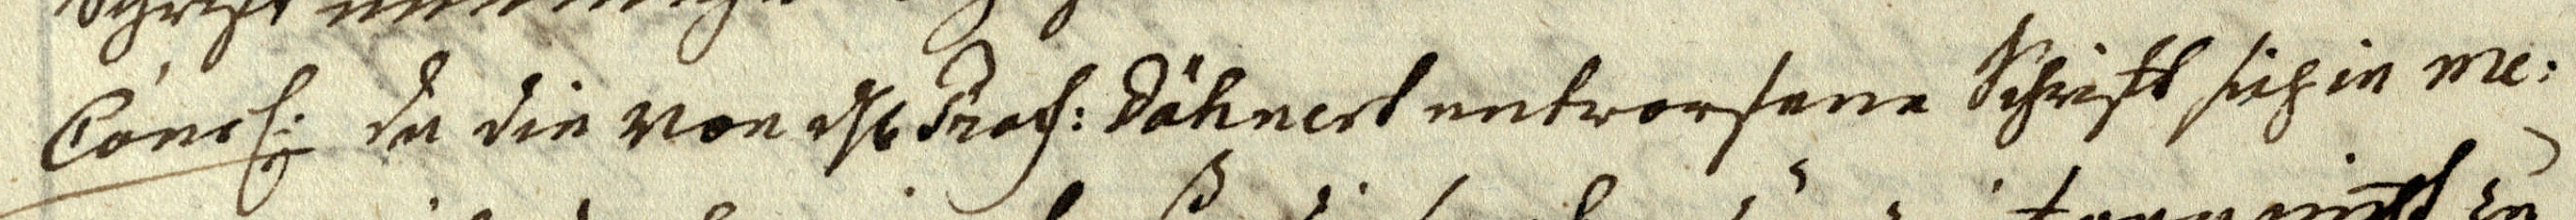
Concl. Da die von dh. Prof. Dähnert entworfene Schrift sich in me¬
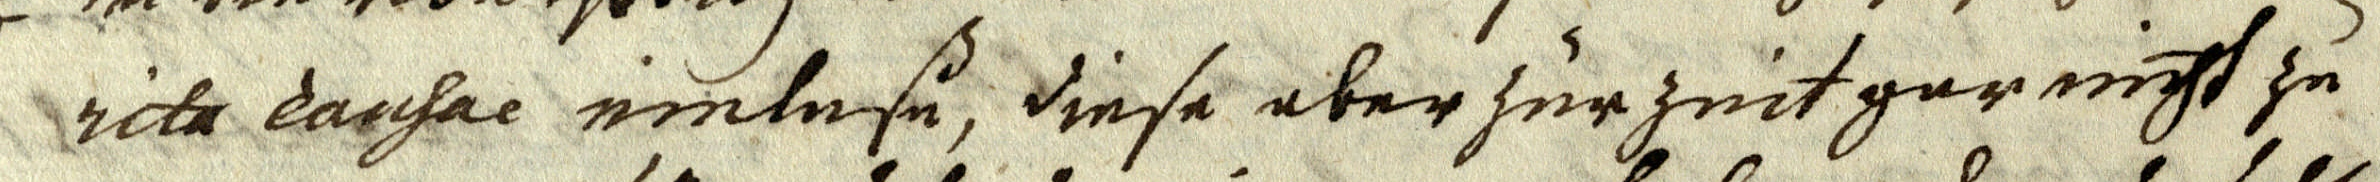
rite causae einlaße, diese aber zur zeit gar nicht zu
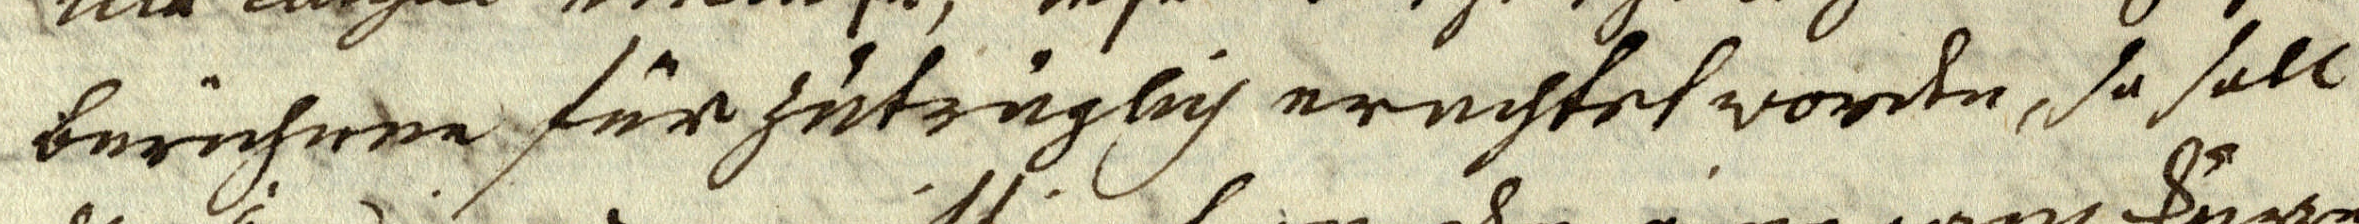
berühren für zuträglich erachtet worden, so soll
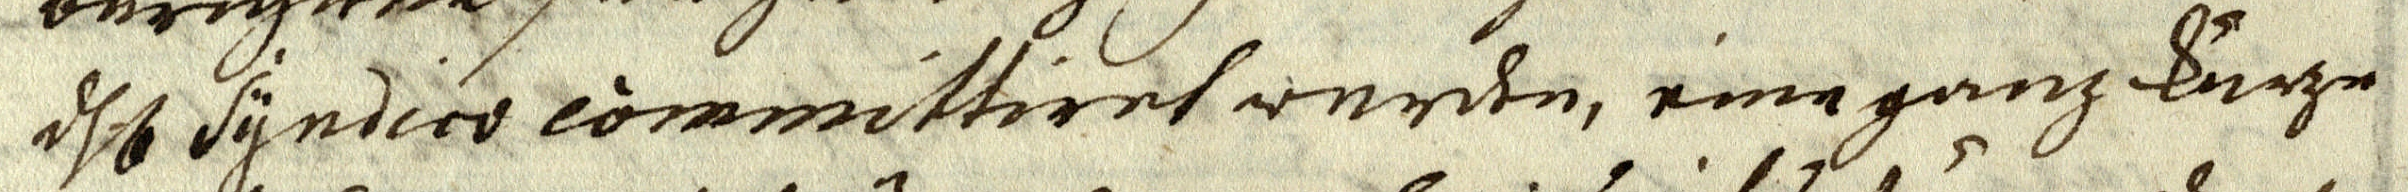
dh. Sÿndico committiret werden, eine ganz kurze
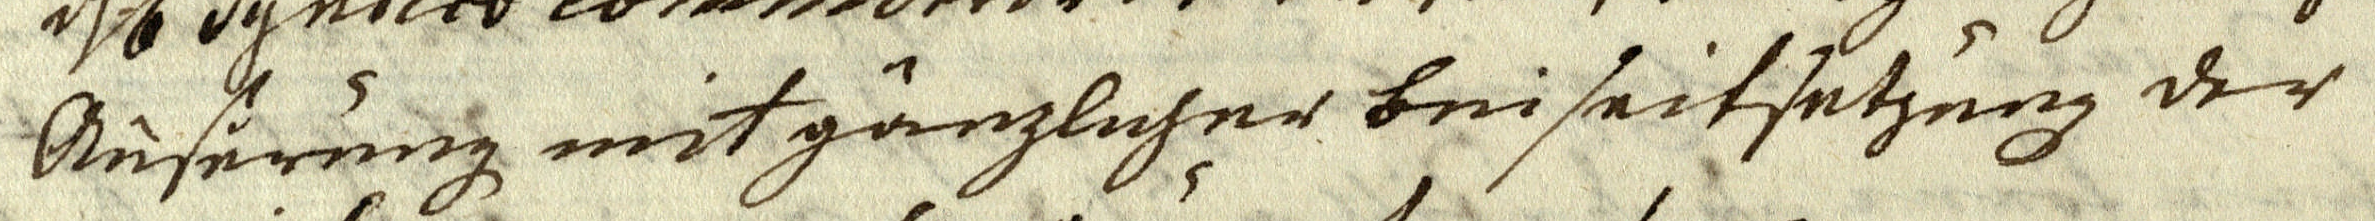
Äußerung mit gänzlicher Beiseitsetzung der
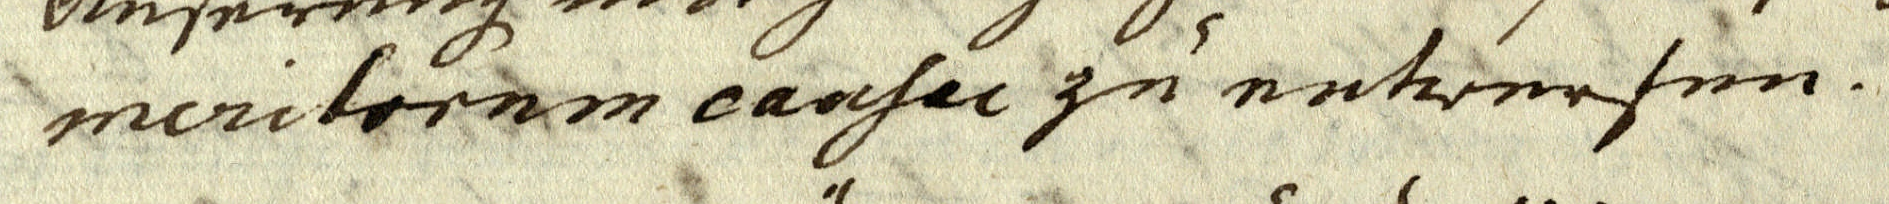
meritorem causae zu entwerfen.
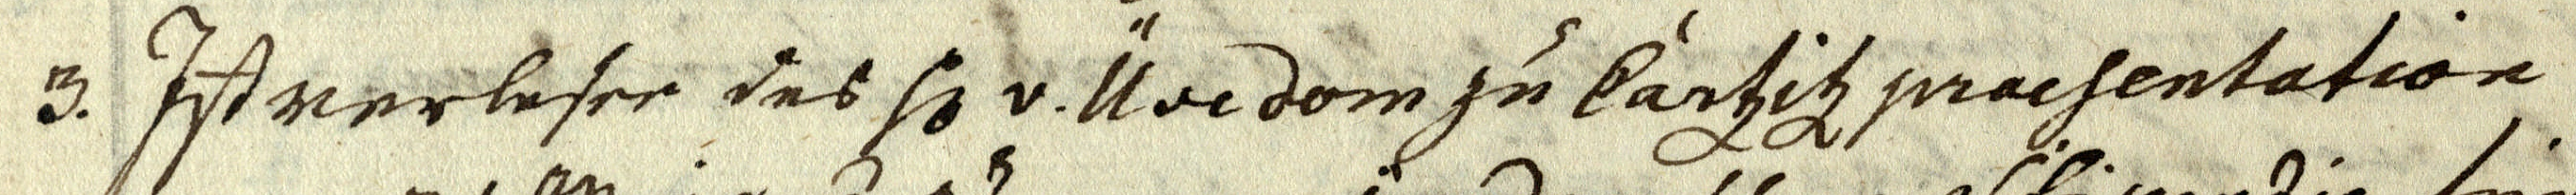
3. Ist verlesen des h. v. Usedom zu Cartzitz praesentation
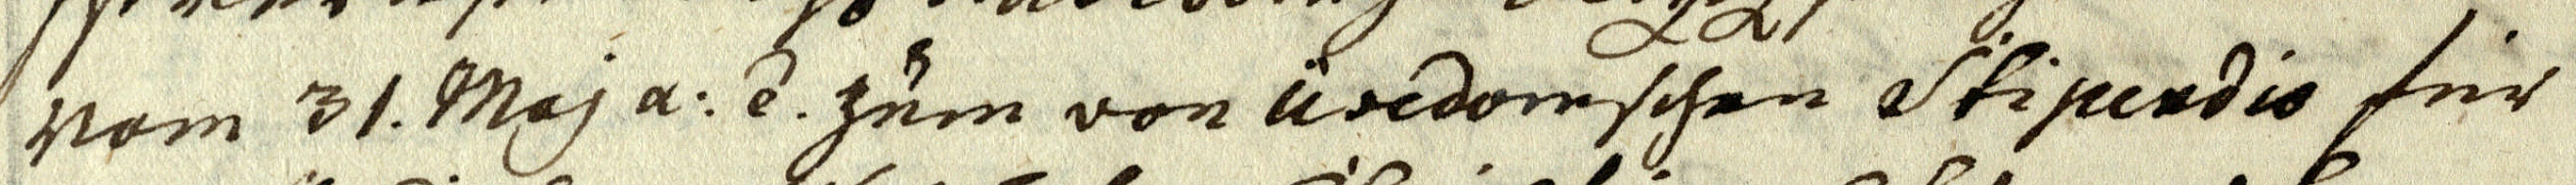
vom 31. Maj a. d. zum von Usedomschen Stipendio für
